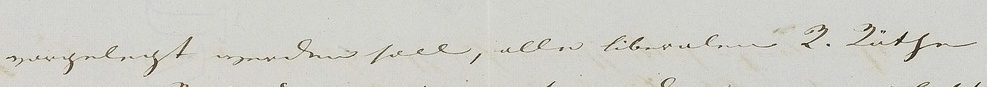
vorgelegt werden soll, alle liberalen R.Räthe
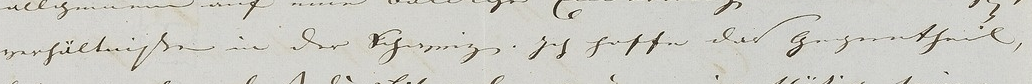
verhältniße in der Schweiz. Ich hoffe das Gegentheil,
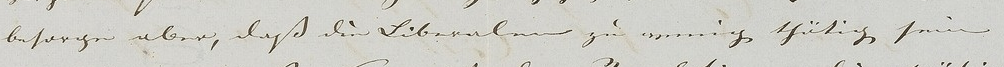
besorge aber, daß die Liberalen zu wenig thätig sein
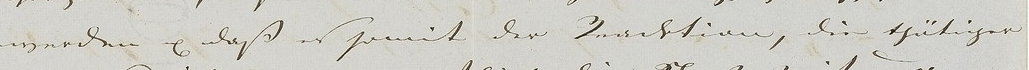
werden & daß es somit der Reacktion, die thätiger
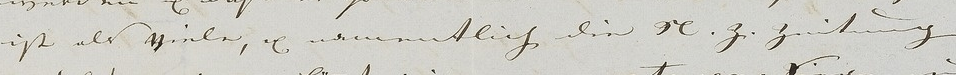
ist als viele, & namentlich die N. Z. Zeitung
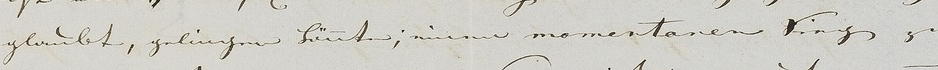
glaubt, gelingen könnte; einen momentanen Sieg zu
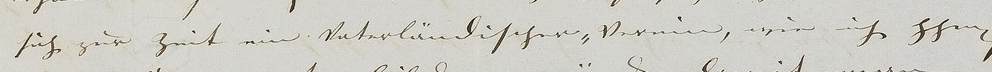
sich zur Zeit ein Vaterländischer-Verein, wie ich Ihnen
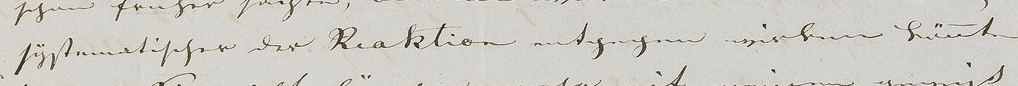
systematischer der Reaktion entgegen wirken könnte.
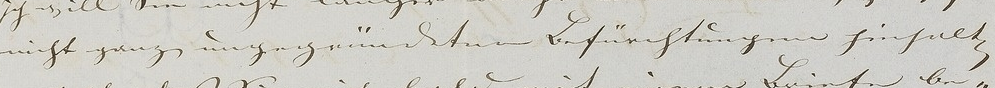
nicht ganz ungegründeten Befürchtungen hinhalten
